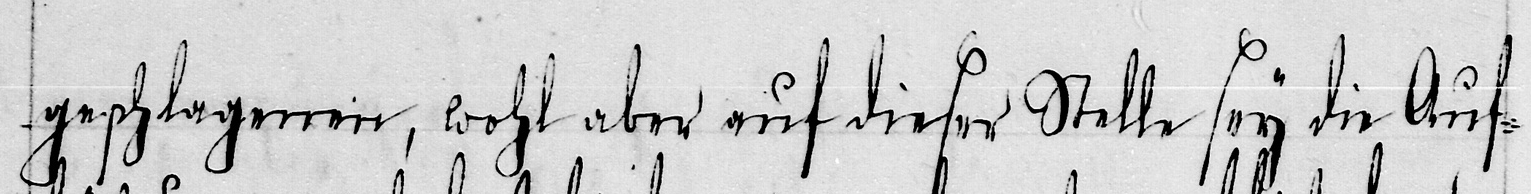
geschlagenen, wohl aber auf dieser Stelle sey die Auf¬
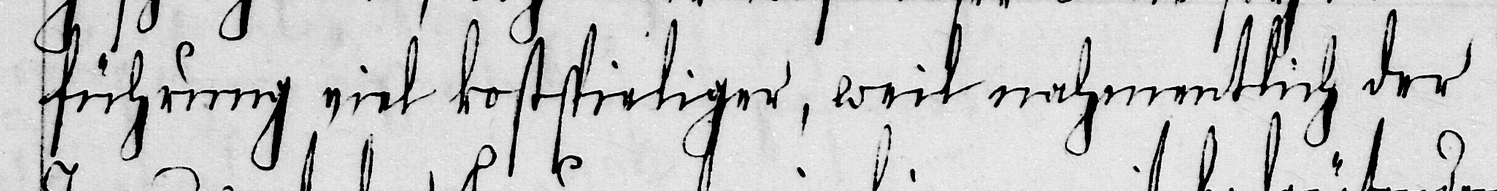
führung viel kostspieliger, weil nahmentlich der
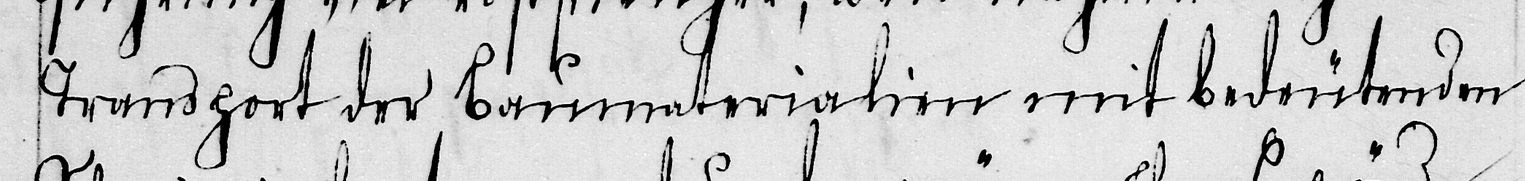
Transport der Baumaterialien mit bedeutenden
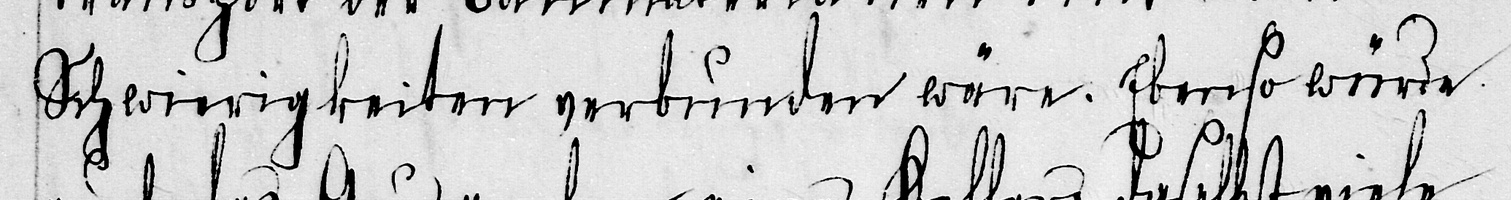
Schwierigkeiten verbunden wäre. Ebenso würde
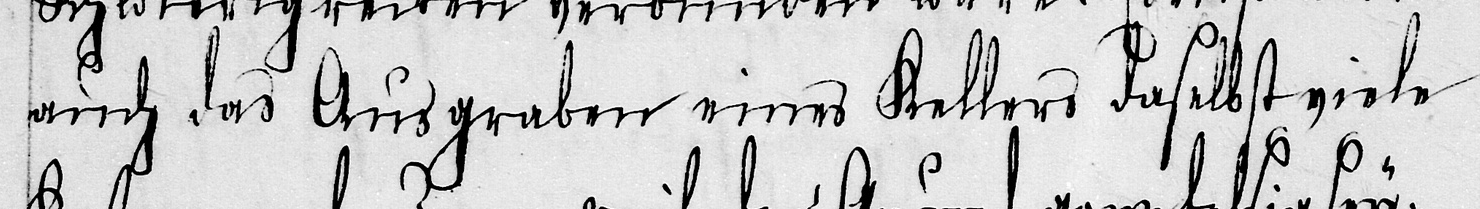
auch das Ausgraben eines Kellers daselbst viele
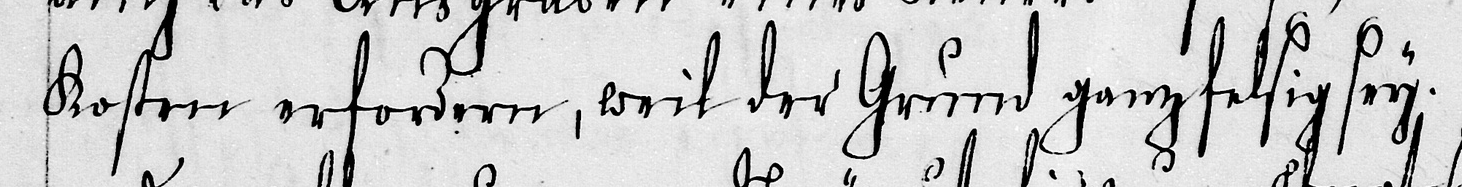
Kosten erfordern, weil der Grund ganz felsig sey.
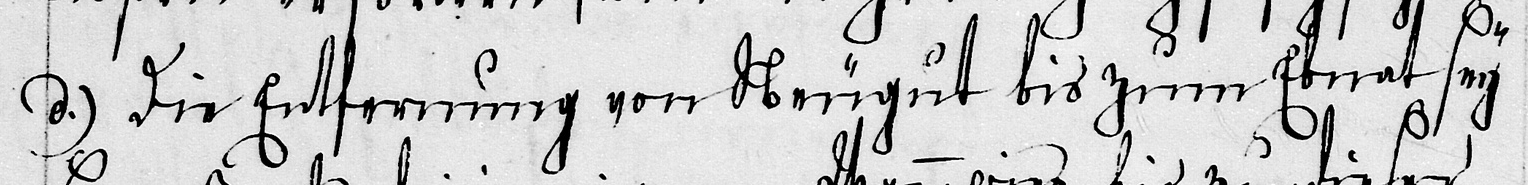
d.) Die Entfernung von Neugut bis zum Ebnat sey
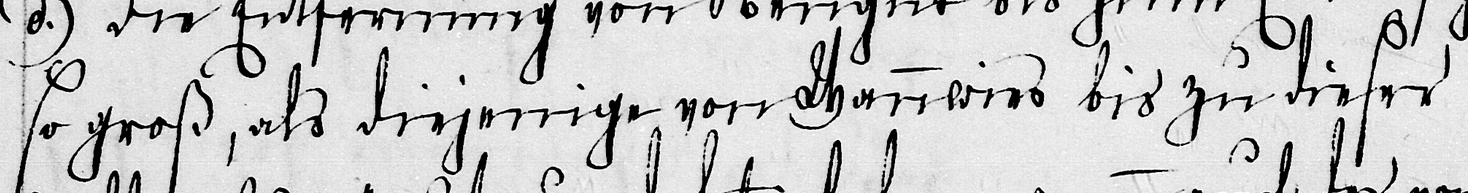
so groß, als diejenige von Wannwies bis zu dieser
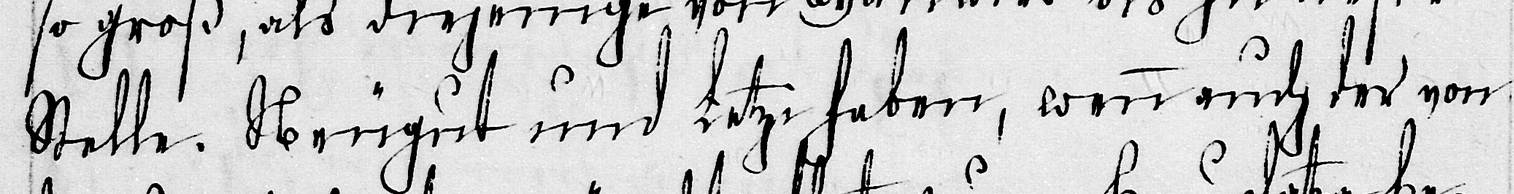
Stelle. Neugut und Letzi haben, wenn auch der von
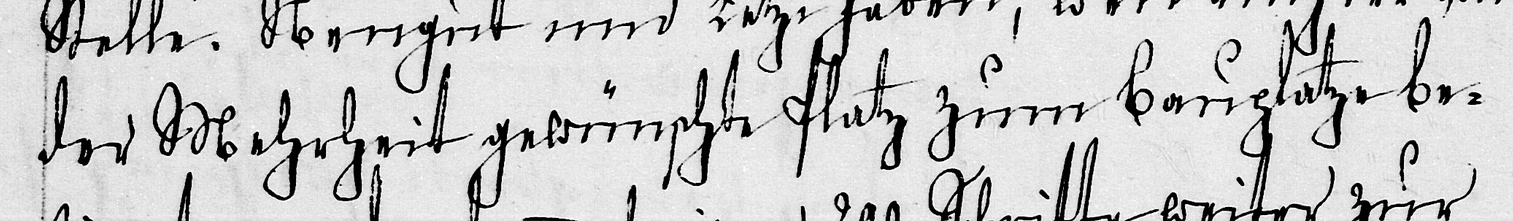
der Mehrheit gewünschte Platz zum Bauplatze be¬
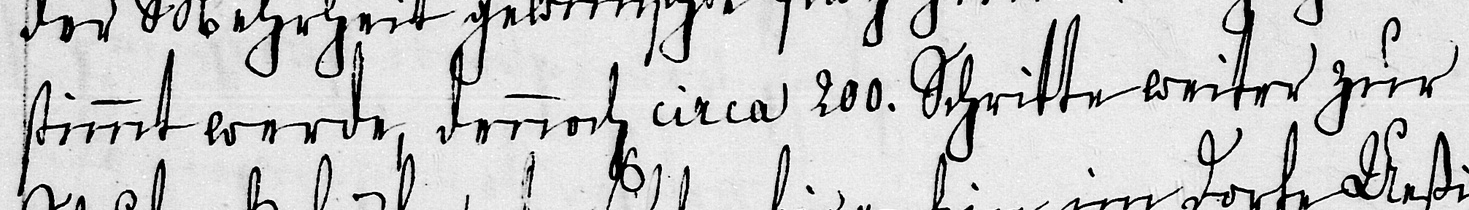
stimmt werde, dennoch circa 200. Schritte weiter zur
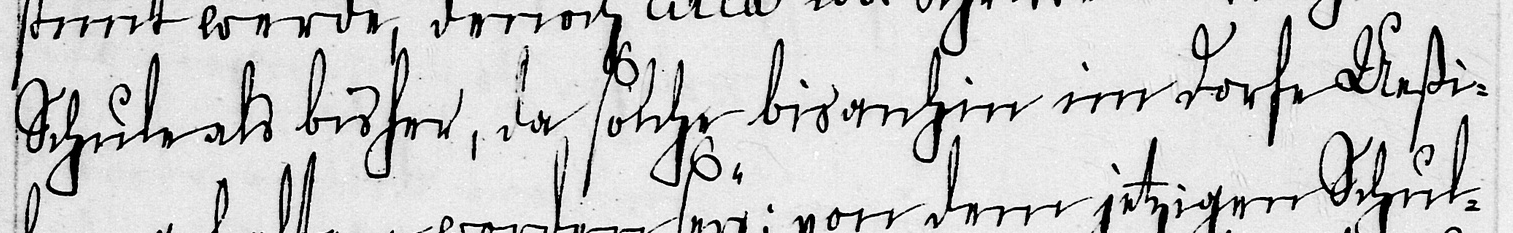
Schule als bisher, da solche bis anhin im Dorfe Ueßi¬
